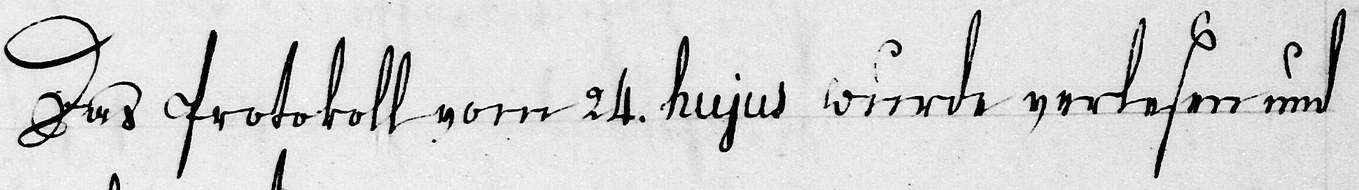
Das Protokoll vom 24. hujus wurde verlesen und
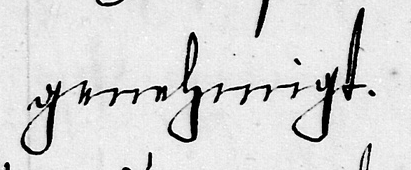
genehmigt.
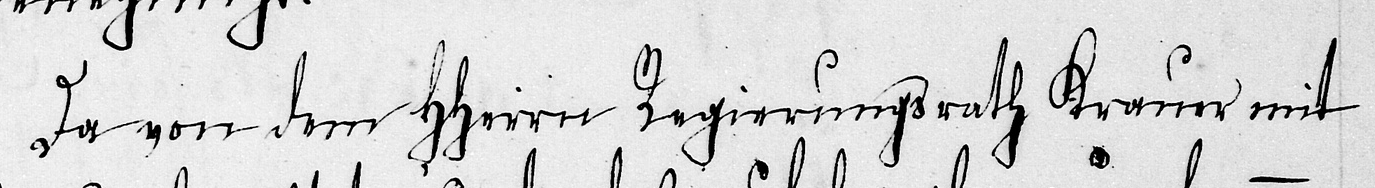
Da von dem HHerrn Regierungsrath Krauer mit
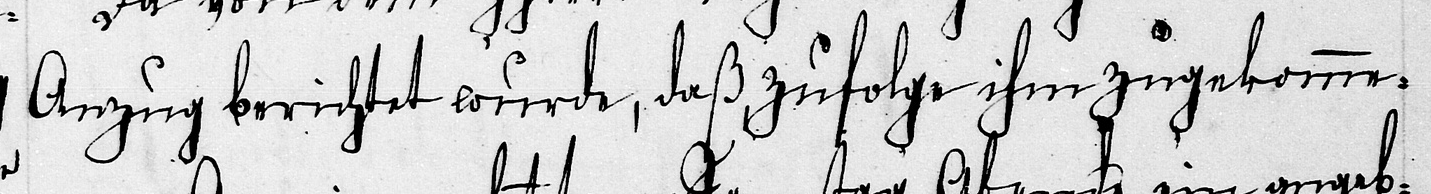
Anzug berichtet wurde, daß zufolge ihm zugekomme¬
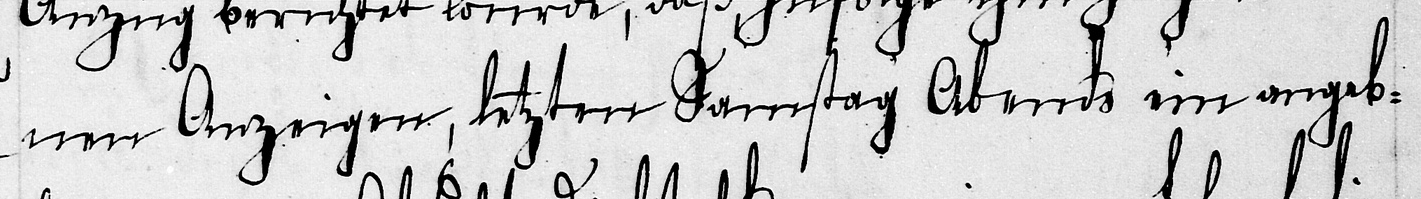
nen Anzeigen, letzten Samstag Abends ein angeb¬
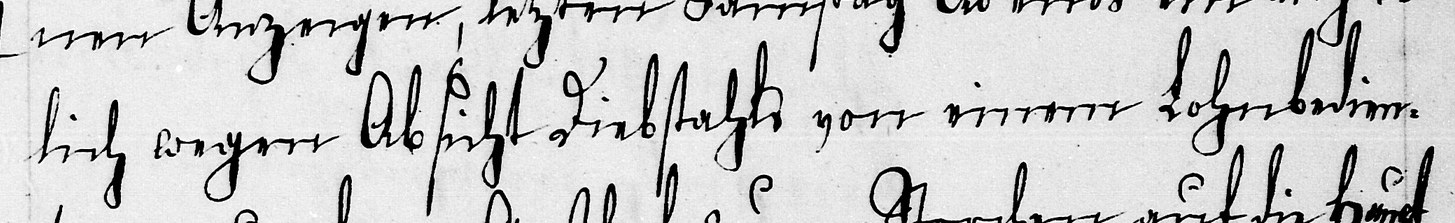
lich wegen Absicht Diebstahls von einem Lohnbedien¬
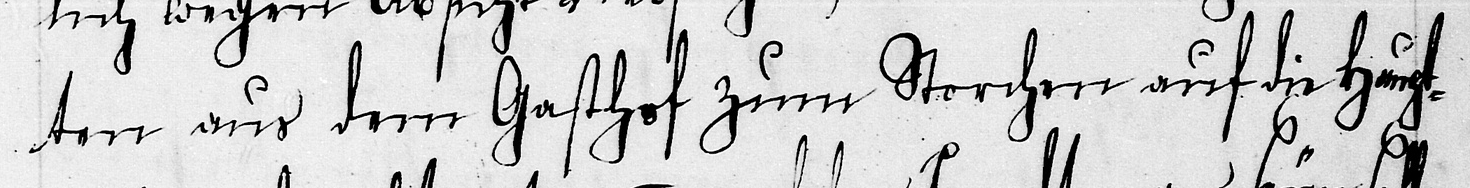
ten aus dem Gasthof zum Storchen auf die Haupt¬
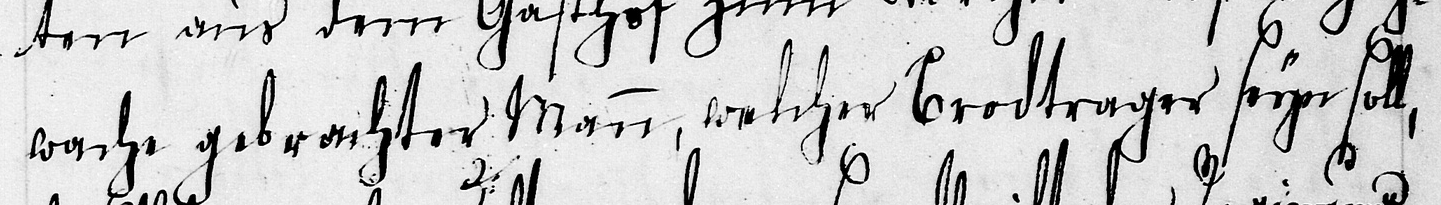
wache gebrachten Mann, welcher Brodtrager seyn sol¬
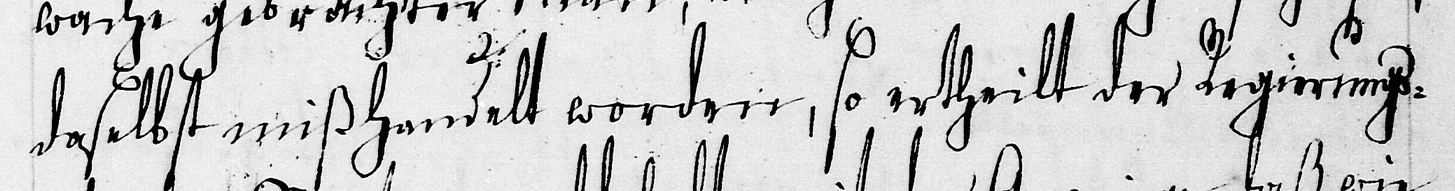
daselbst mißhandelt worden, so ertheilt der Regierungs¬
